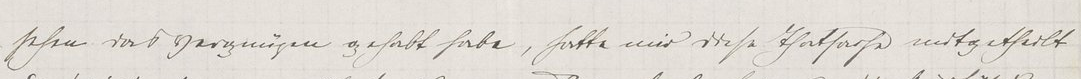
sehen das Vergnügen gehabt habe, hatte mir diese Thatsache mitgetheilt
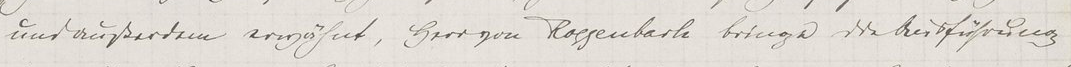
und außerdem erwähnt, Herr von Roggenbach bringe die Ausführung
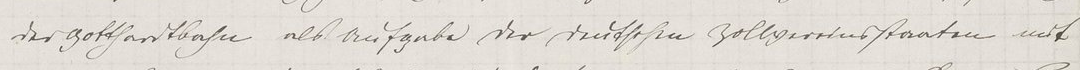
der Gotthardbahn als Aufgabe der deutschen Zollvereinsstaaten mit
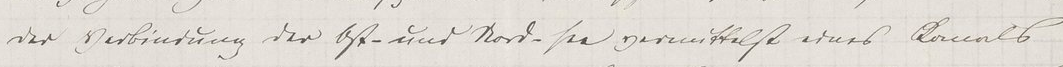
der Verbindung der Ost- und Nord-see vermittelst eines Kanals
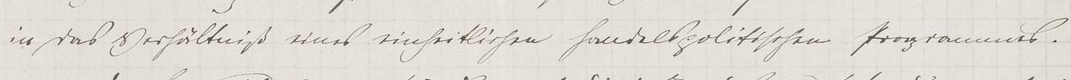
in das Verhältniß eines einheitlichen Handelspolitischen Programmes.
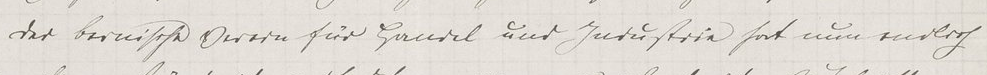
Der bernische Verein für Handel und Industrie hat nun endlich
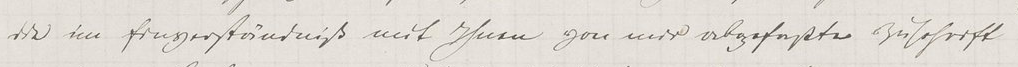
die im Einverständniß mit Ihnen von mir abgefaßte Zuschrift
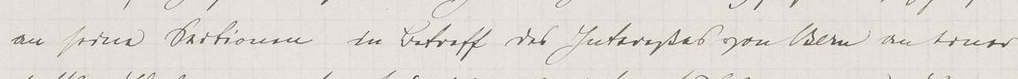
an seine Sectionen in Betreff des Intereßes von Bern an einer
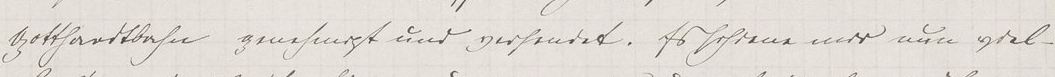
Gotthardbahn genehmigt und versendet. Es schiene mir nun viel-
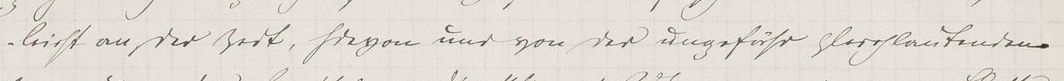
leicht an der Zeit, hievon und von der ungefähr gleichlautenden
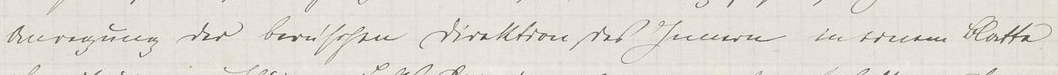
Anregung der bern'schen Direktion des Innern in einem Blatte
